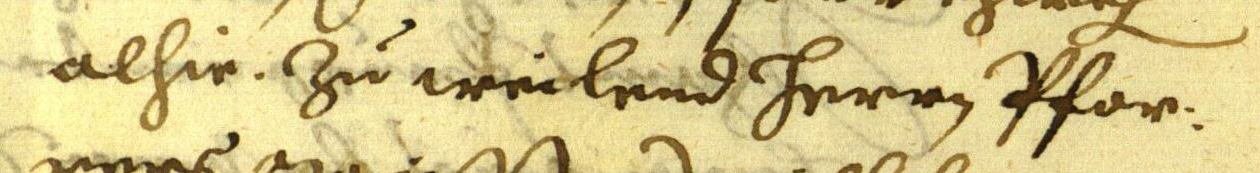alhie. Zū weilend herrn Pfar¬
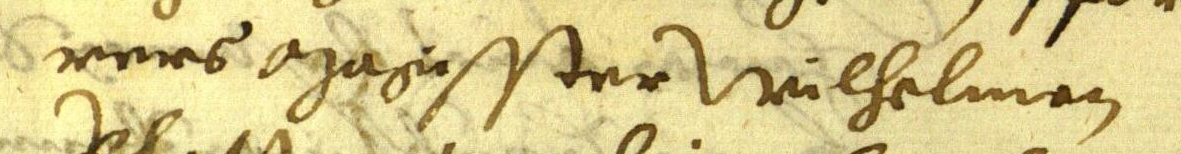rers Magisster Wilhelmen
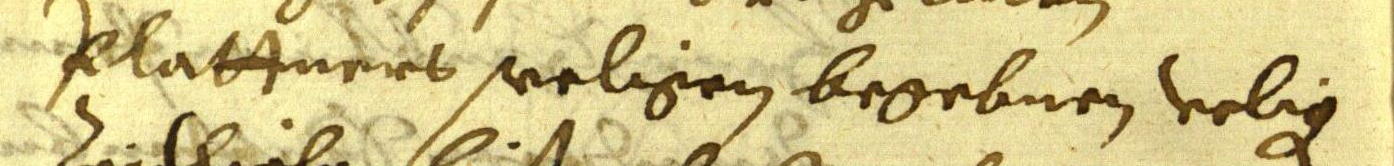Plattners seligen begebnen velig
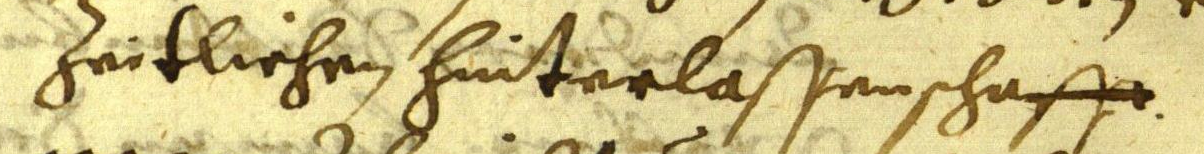Zeitlichen hinterlassenschafft
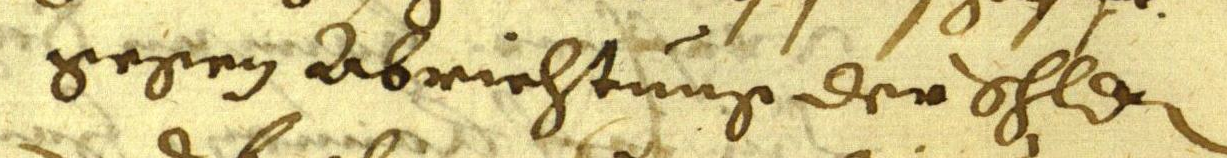gegen Abrichtūng der Schld
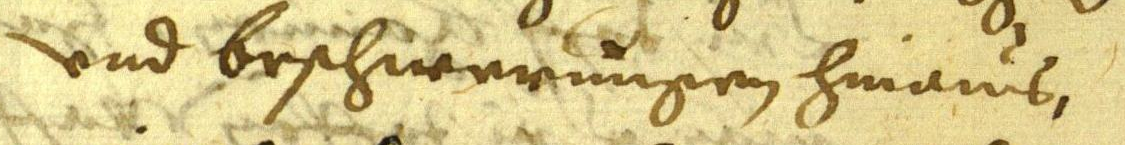vnd beschwerūngen hinaūs,
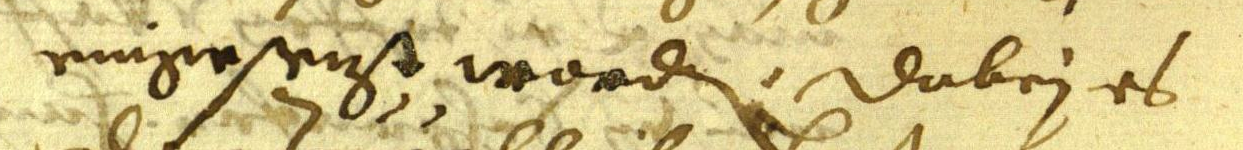eingesezt word, dabei es
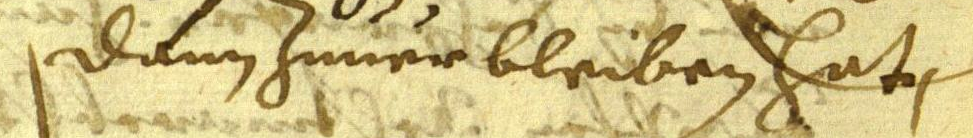dann Zūuērbleiben hat,
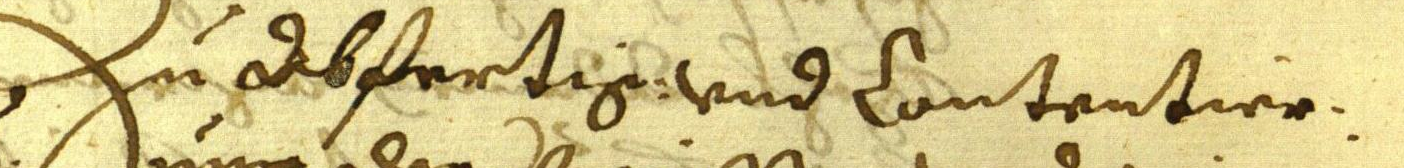Zū Abfertig: vnd Contentier¬
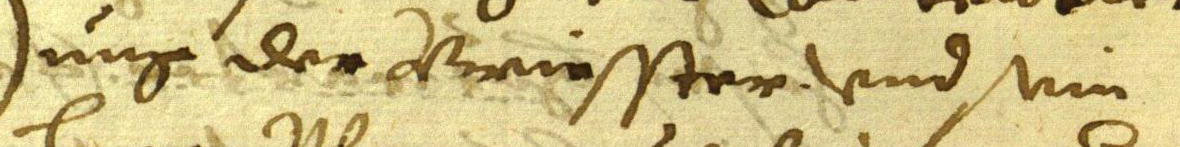ūng der Briesster. vnd sein
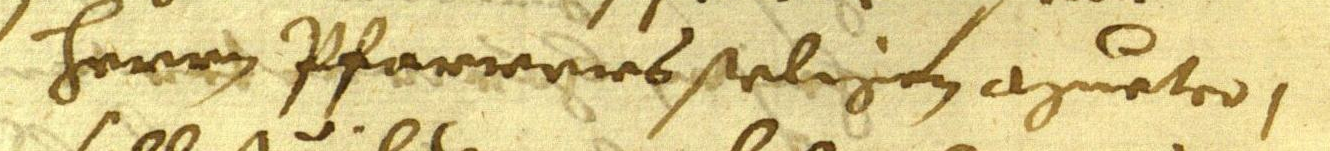herrn Pfarrers seligen Mūeter,
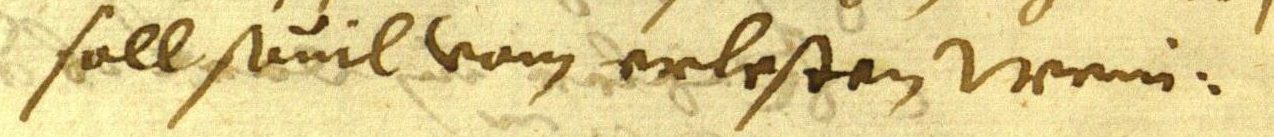soll soūil vom erlesten Wein¬
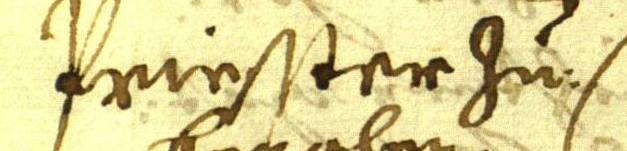Priesster Zū
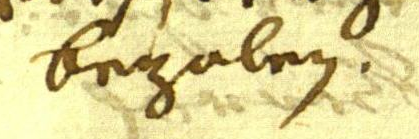bezalen.
